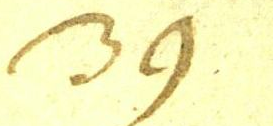39
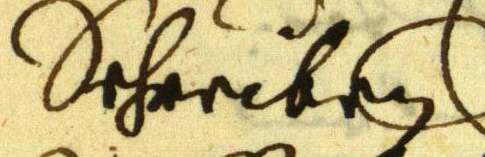Schreiben
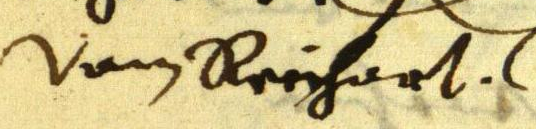Vom Reichart.
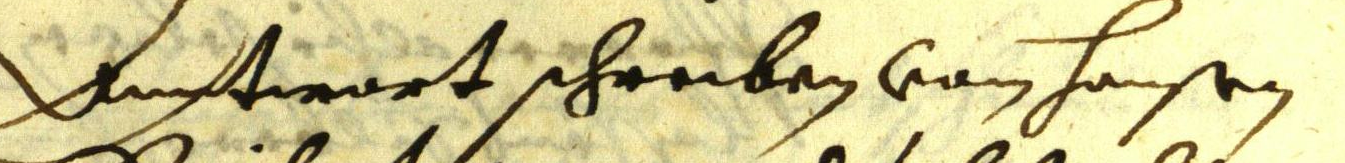Anntwort schreiben von hansen
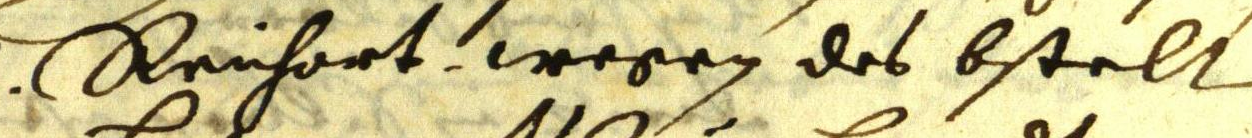Reichart. wegen des bstelt
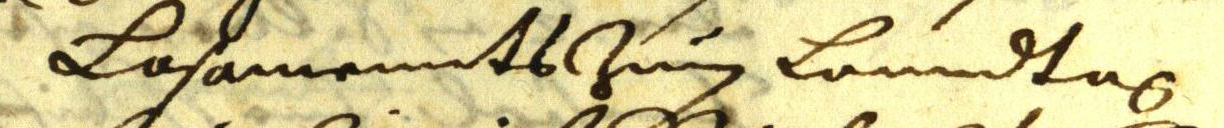Losamennts Zūm Lanndtag
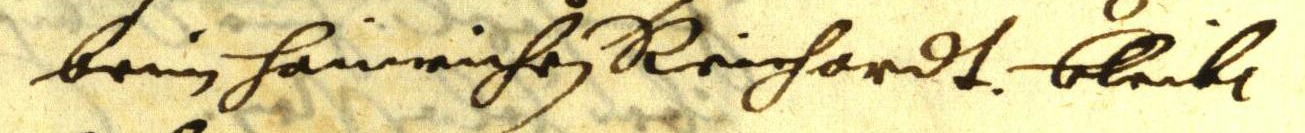beim hainrichen Reichardt. bleibt
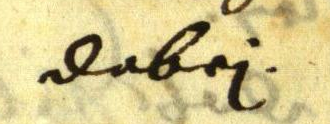dabej.
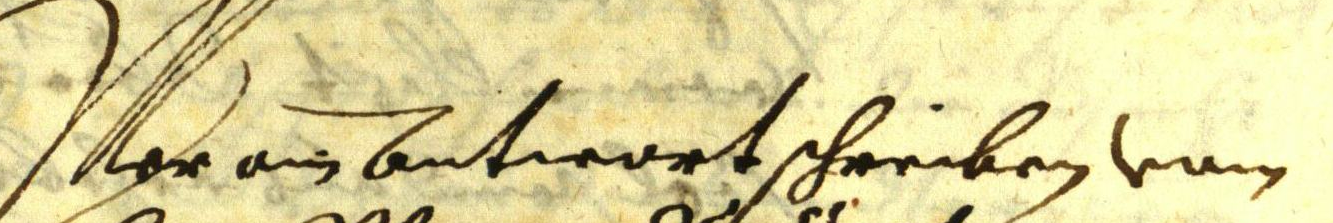Mer ain Antwortschreiben vom
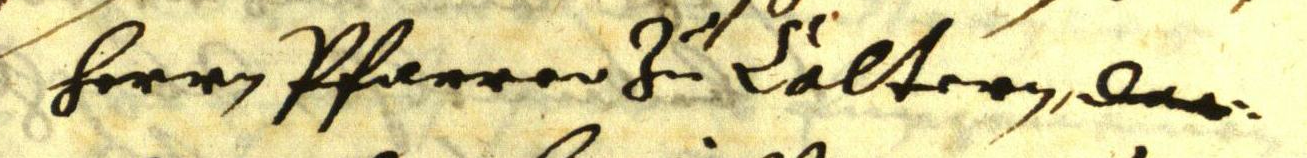herrn Pfarrer Zū Caltern, dar
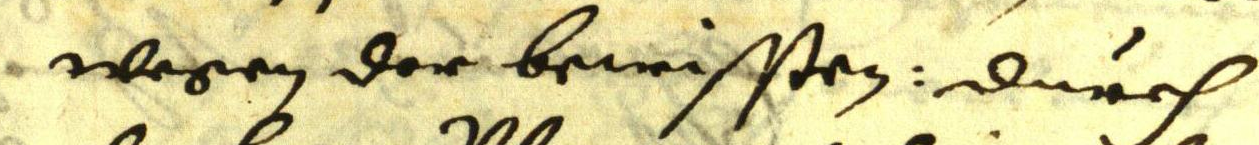wegen der bewissten: dūrch
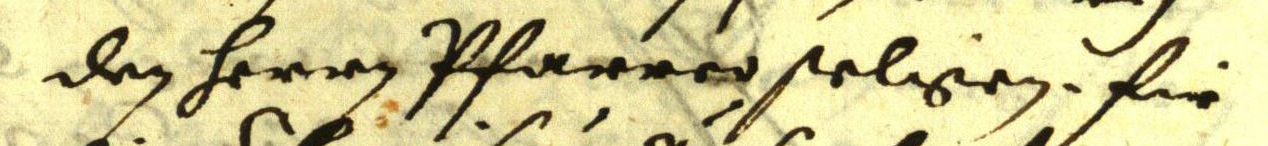den herrn Pfarrer seligen. fir
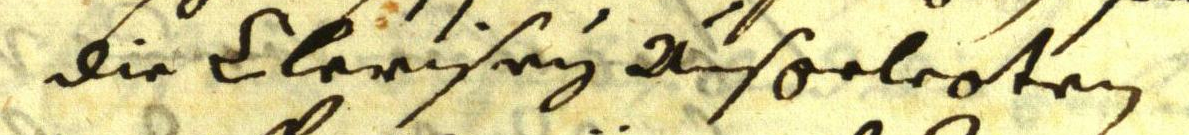die Cleriseȳ Aūsgelegten
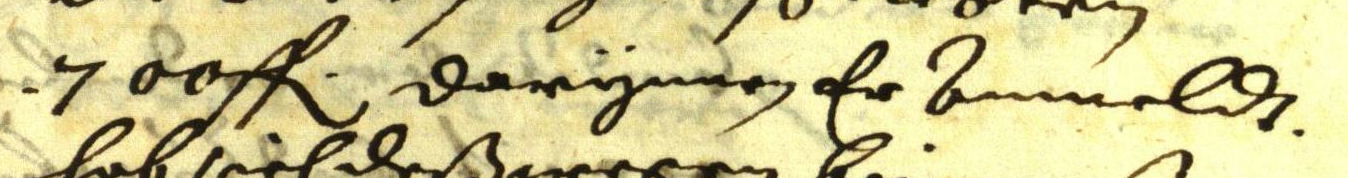.700 fl. darÿnnen Er Anmeldt.
